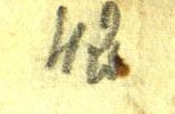42
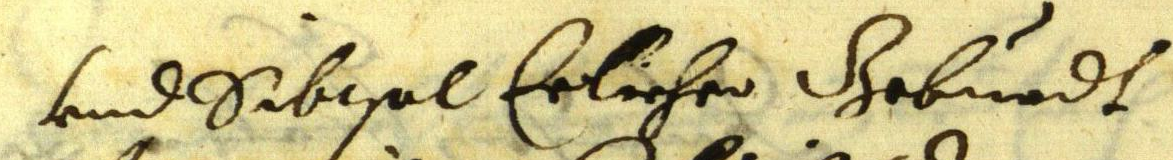vnd Sibtsal Eelicher Gebūrdt
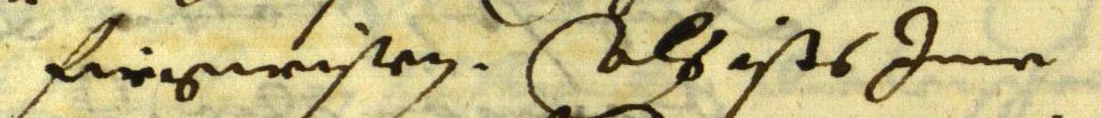firgwisen. Als ists Ime
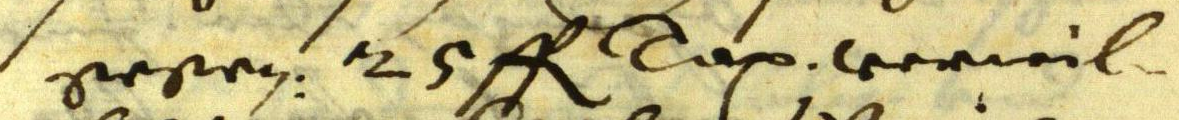gegen: 25 fl Tax. verwil¬
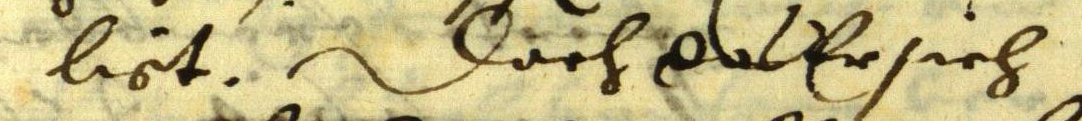ligt. Doch das Er sich
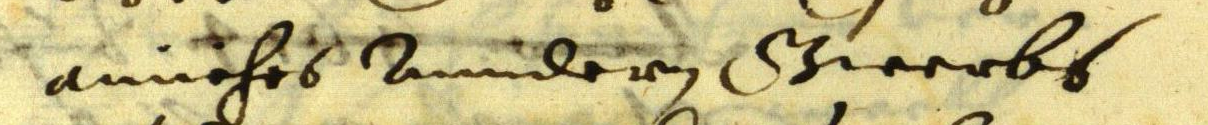ainiches Anndern Gwerbs
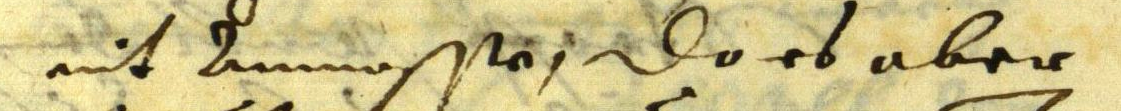nit Anmasse, da es aber
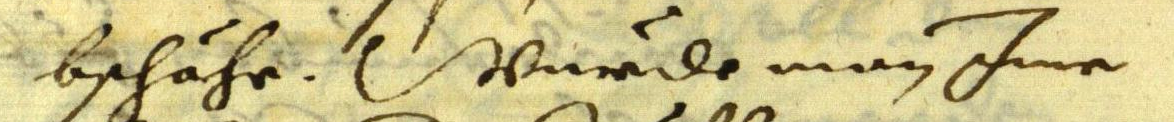beschōhe. Wūrde man Ime
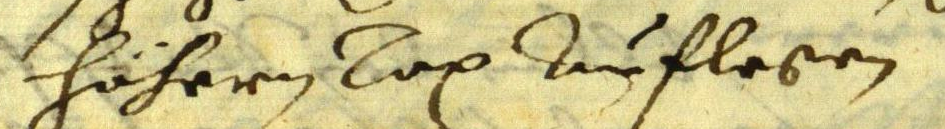höhern Tax Aūflegen.
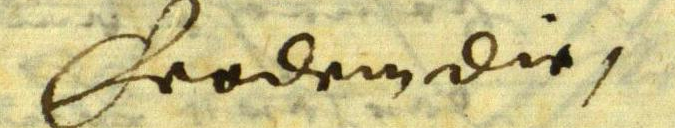Eeodem die,
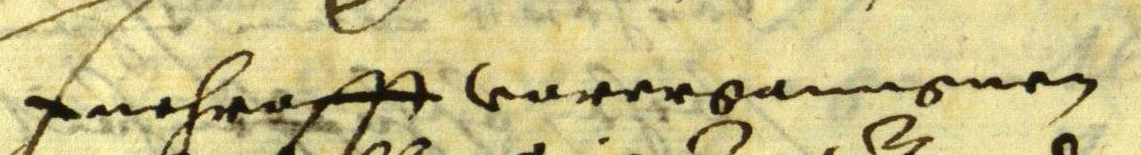Inchrafft vorerganngnen
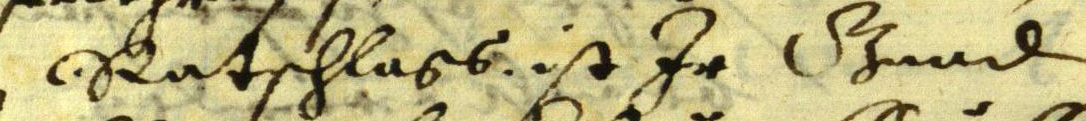Ratschlags. ist Ir Gnad
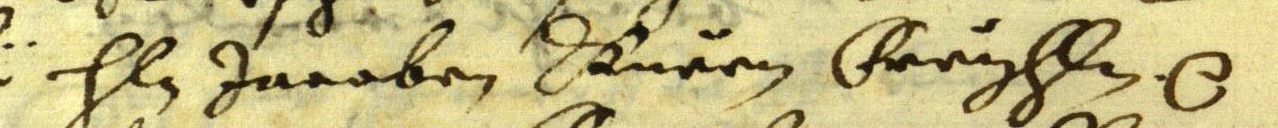hln Jacoben Kūeen Freȳherrn etc.
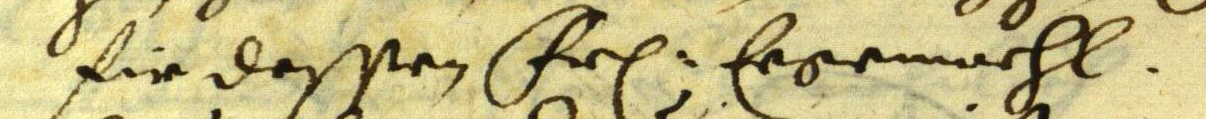fir dessen Fr: Eegemaehl.
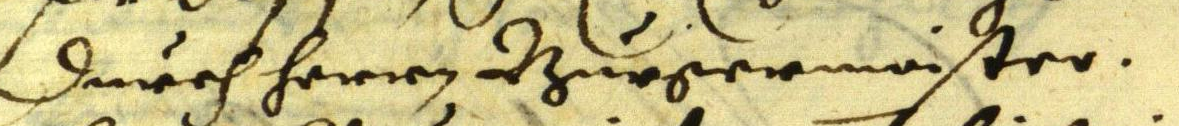dūrch herrn Būrgermaister.
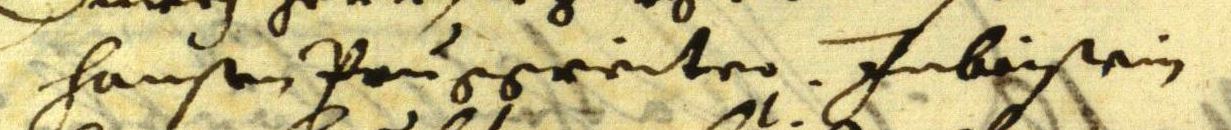hansen Prūggreiter. Inbeisein
